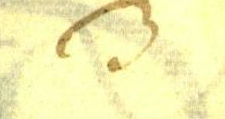3
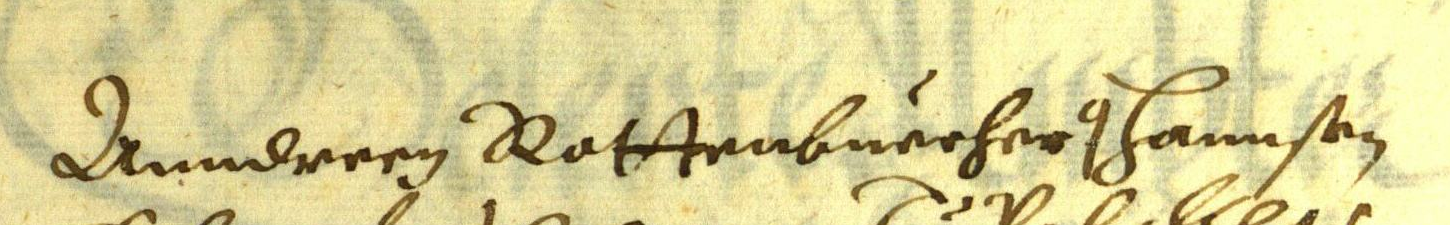Anndreen Rottenbūecher. Hannsen
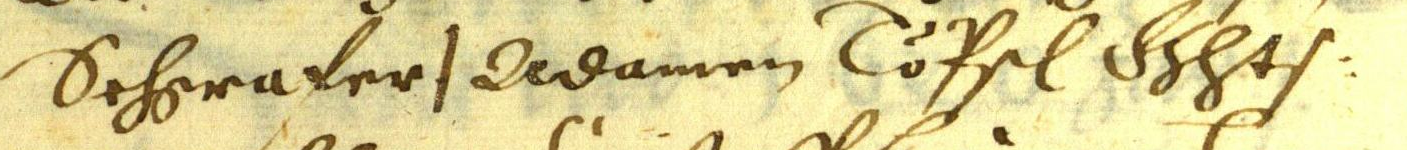Schgrafer/ Adamen TōPsl Rhts¬
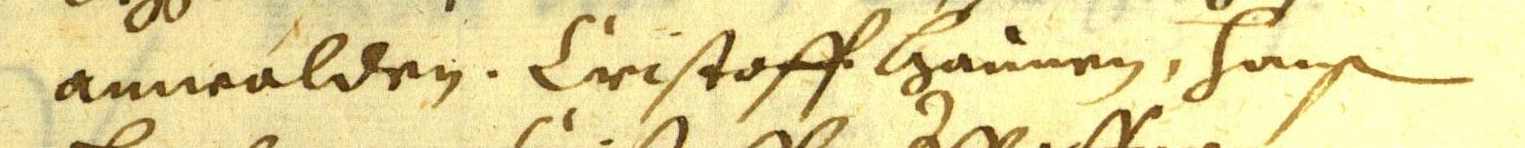anwalden. Cristoff Haimen, Hans
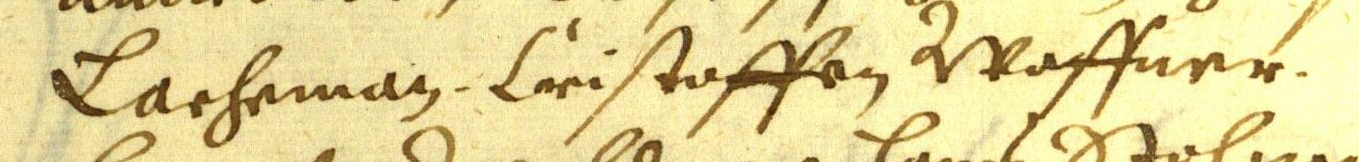Lacheman. Cristoffen Waffner.
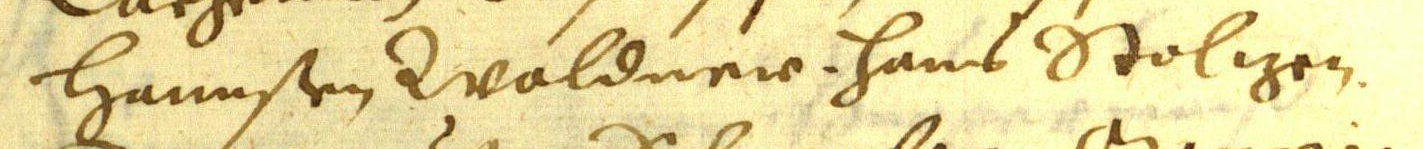Hannsen Waldner. hans Stoltzen.
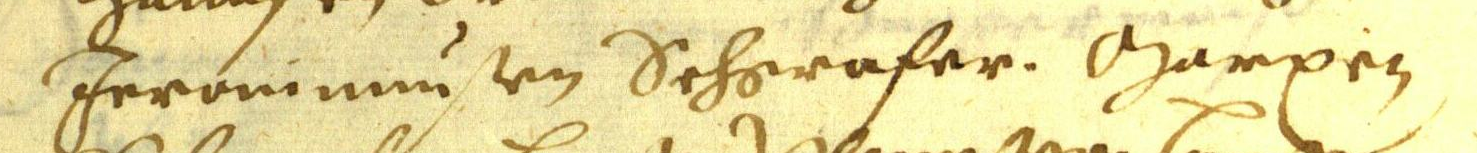Ieronimūsen Schgrafer. Marxen
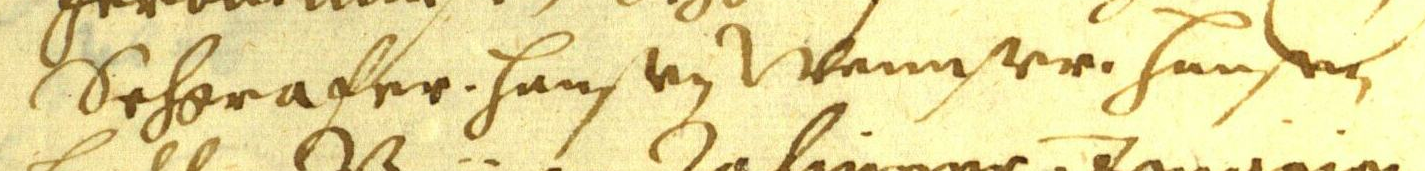Schgrafer. hansen Wennster. hansen
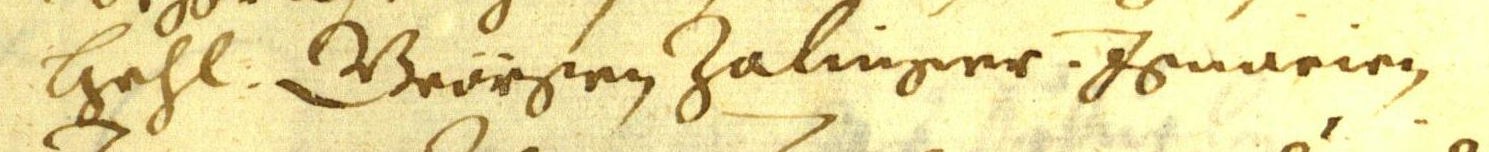Hehl. Geörgen Zalinger. Ignacien
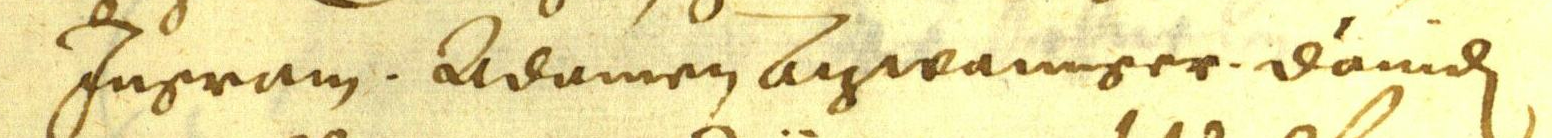Ingram. Adamen Azwannger. daūid
